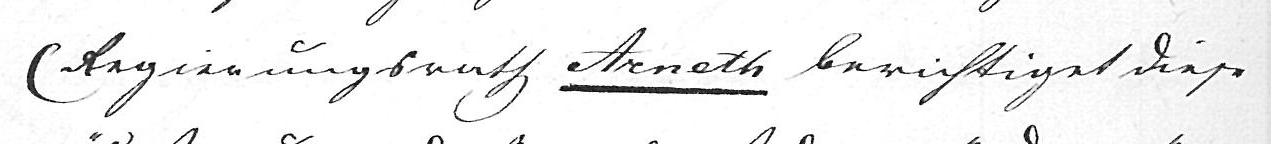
(Regierungsrath Arneth berichtiget diese
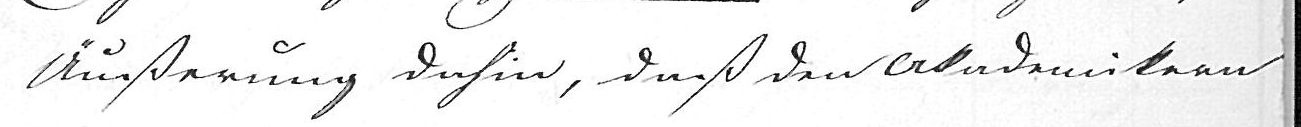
Äußerung dahin, daß den Akademikern
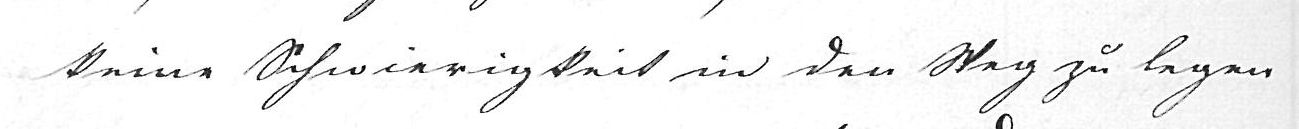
keine Schwierigkeit in den Weg zu legen
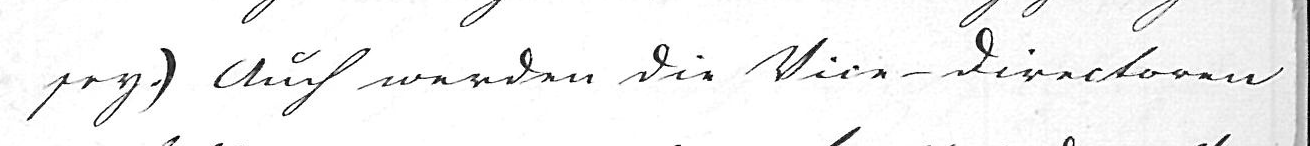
sey.) Auch werden die Vice-Directoren
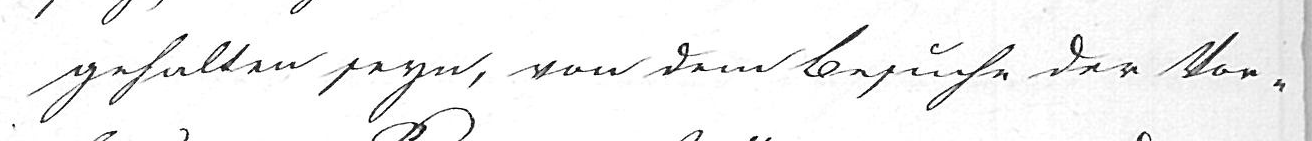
gehalten seyn, von dem Besuche der Vor-
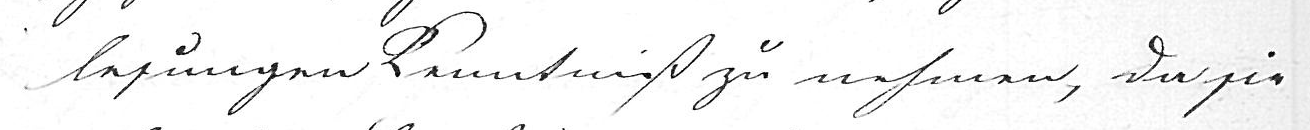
lesungen Kenntniß zu nehmen, da sie
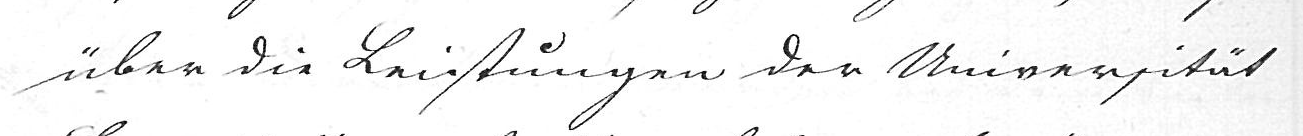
über die Leistungen der Universität
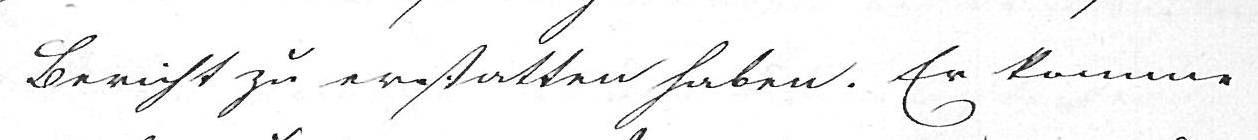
Bericht zu erstatten haben. Er komme
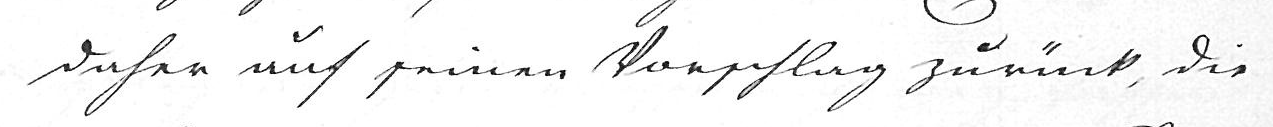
daher auf seinen Vorschlag zurück, die
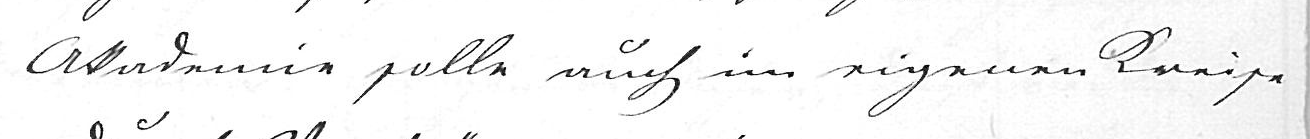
Akademie solle auch im eigenen Kreise
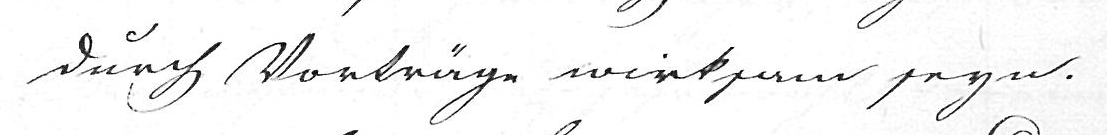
durch Vorträge wirksam seyn.
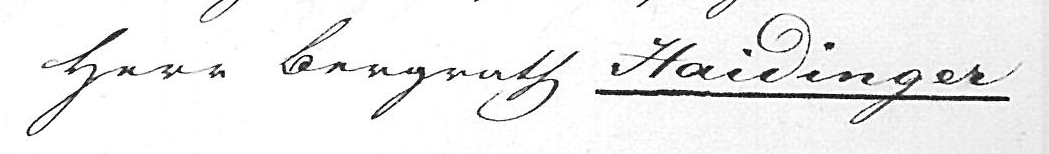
Herr Bergrath Haidinger
